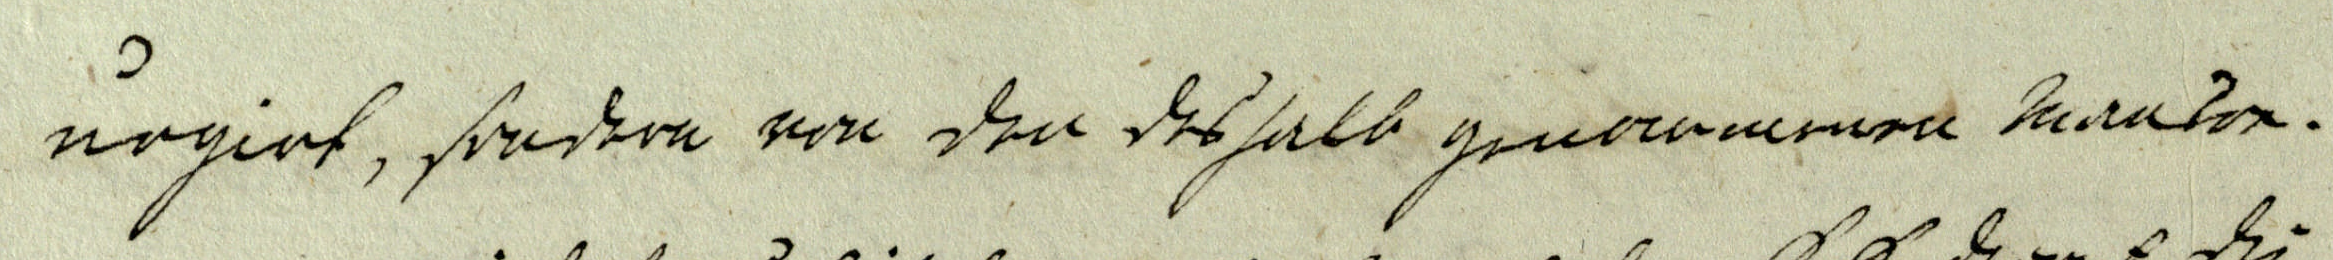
urgirt, sondern von den deshalb genommenen Maasre¬
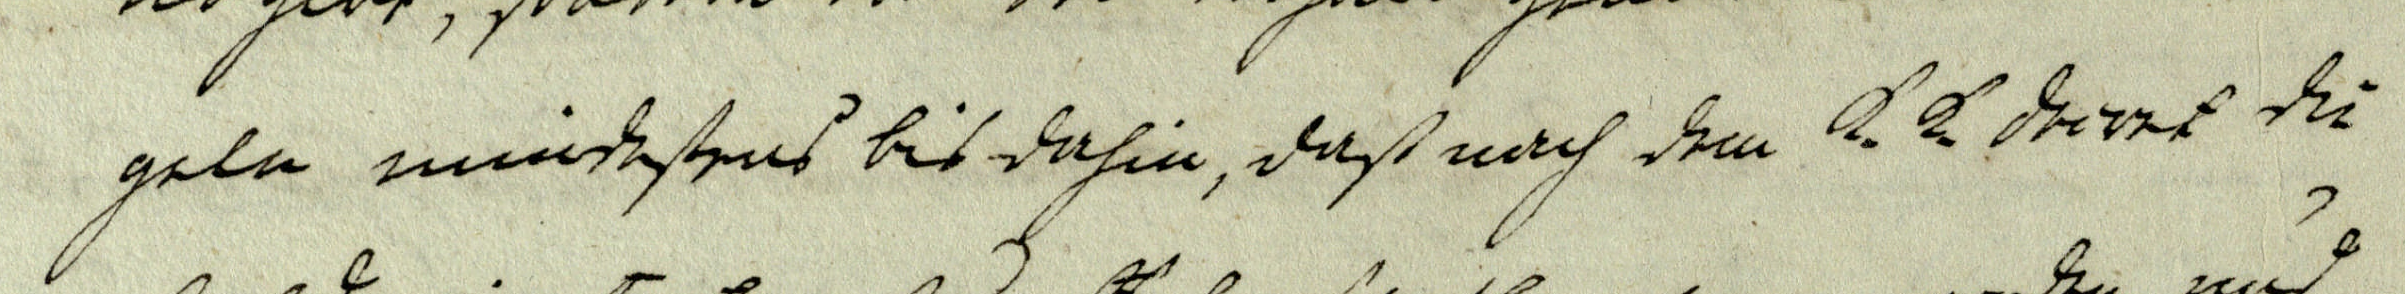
geln mindesten bis dahin, daß nach dem K. K. Decret die
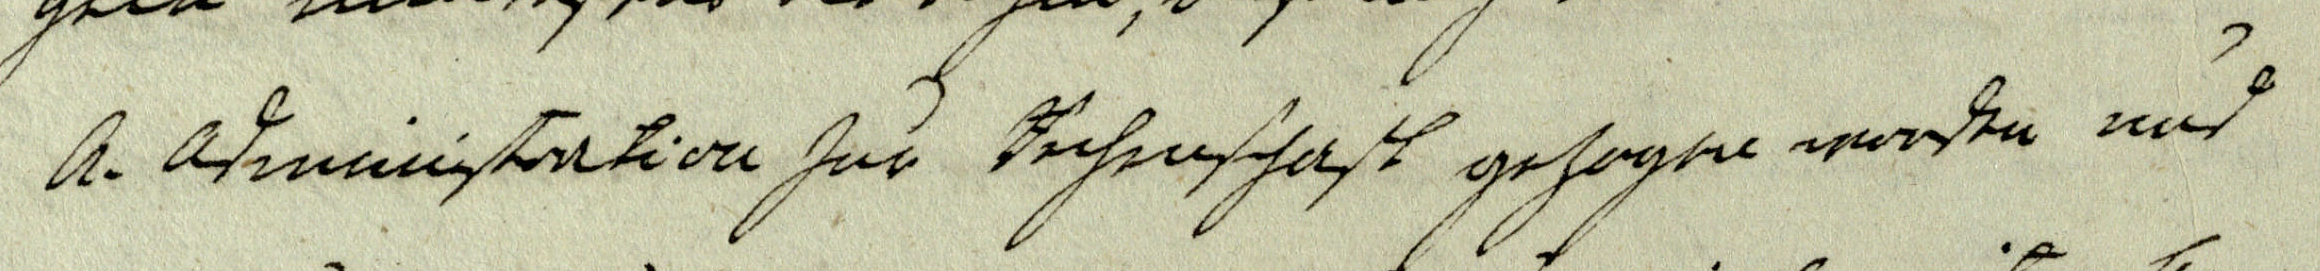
A. Administration zur Rechenschaft gezogen worden und
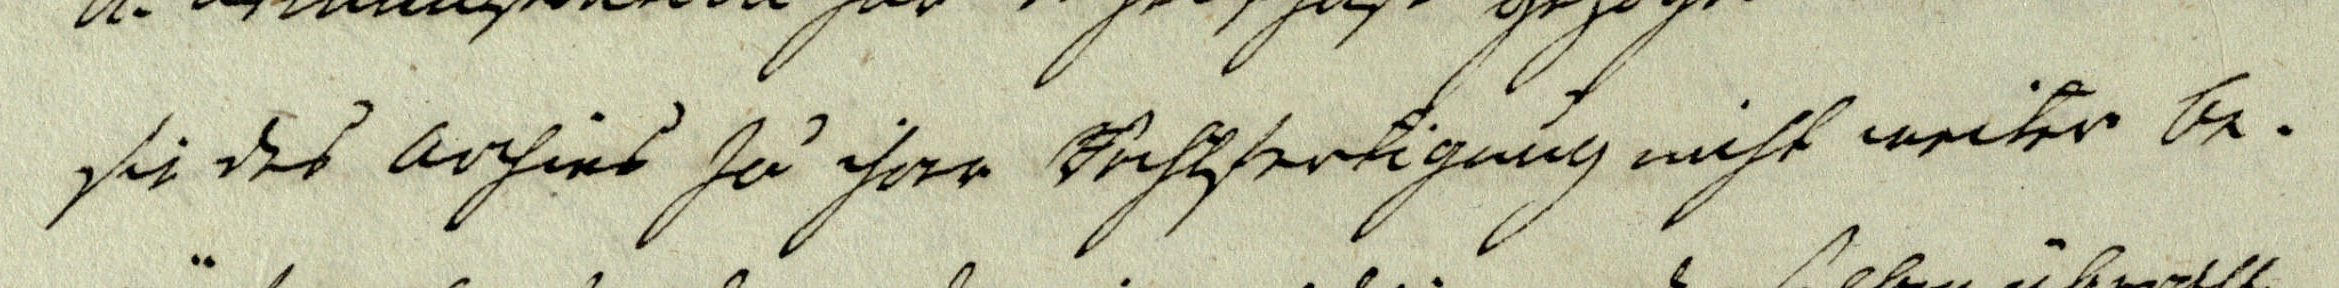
sie des s zu ihrer Rechtfertigung nicht weiter be¬
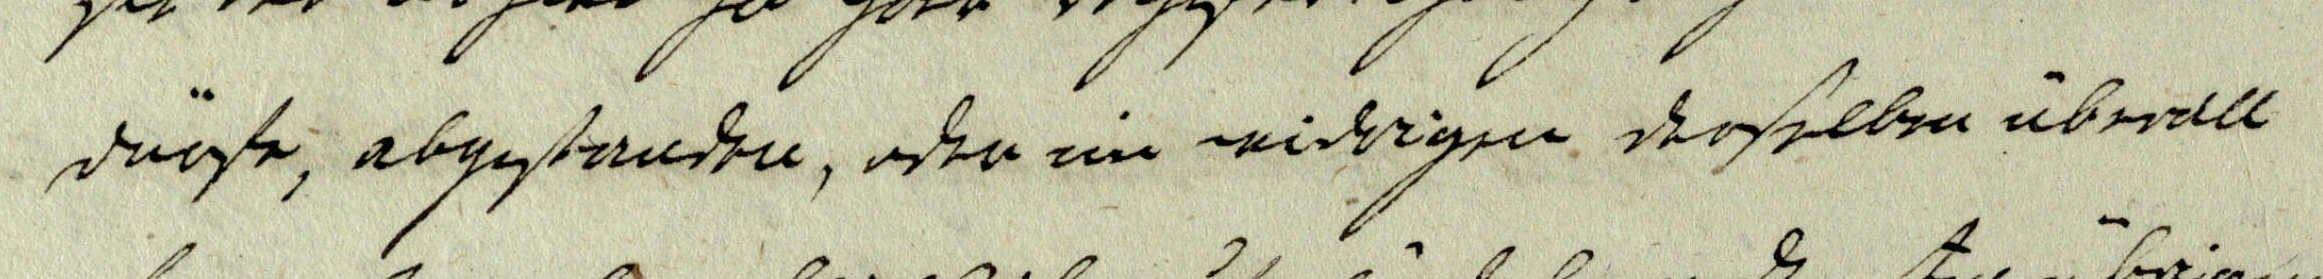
dürfe, abgestanden, oder im widrigen derselben überall
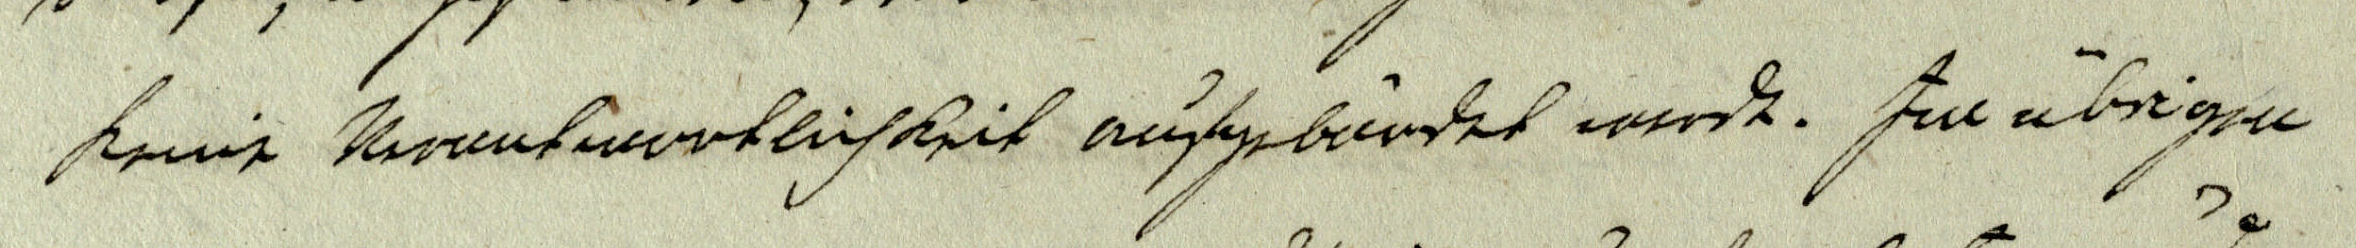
keine Verantwortlichkeit aufgebürdet werde. Im übrigen
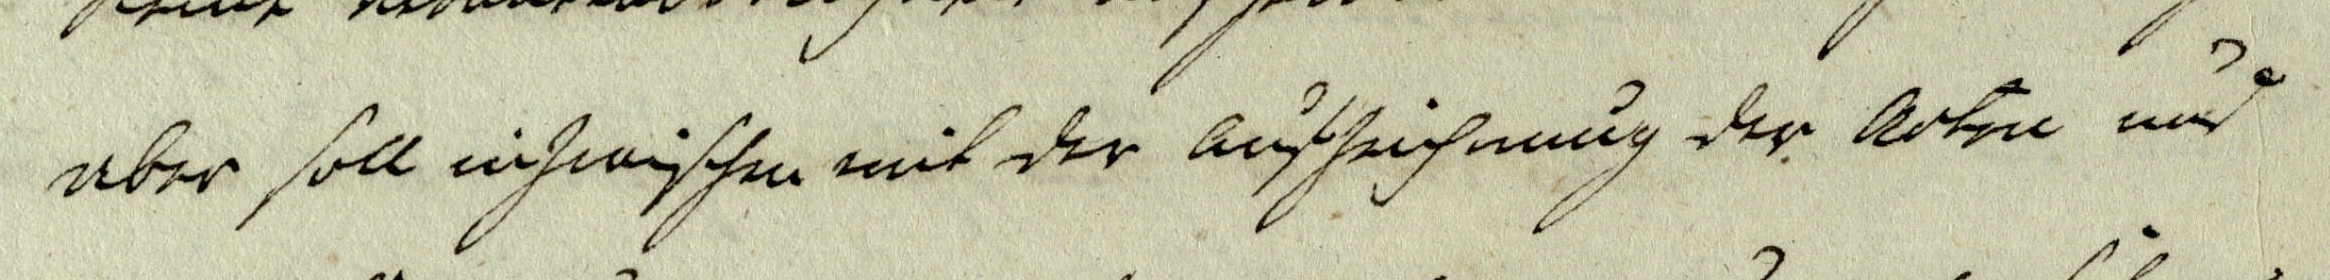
aber soll inzwischen mit der Aufzeichnung der Acten und
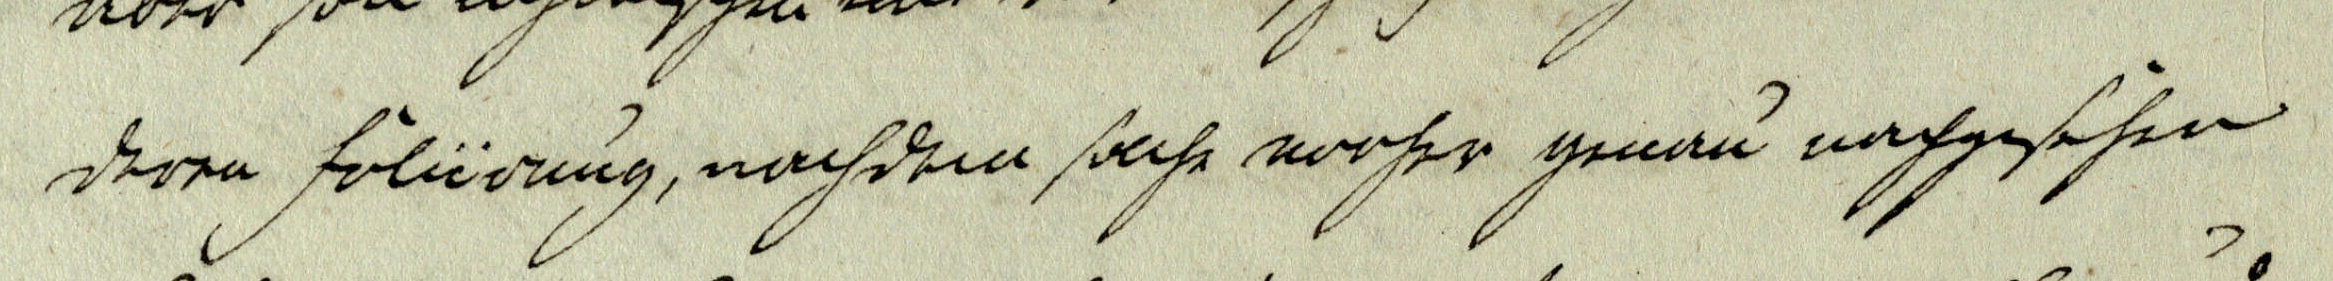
deren Foliirung, nachdem solche vorher genau nachgesehen
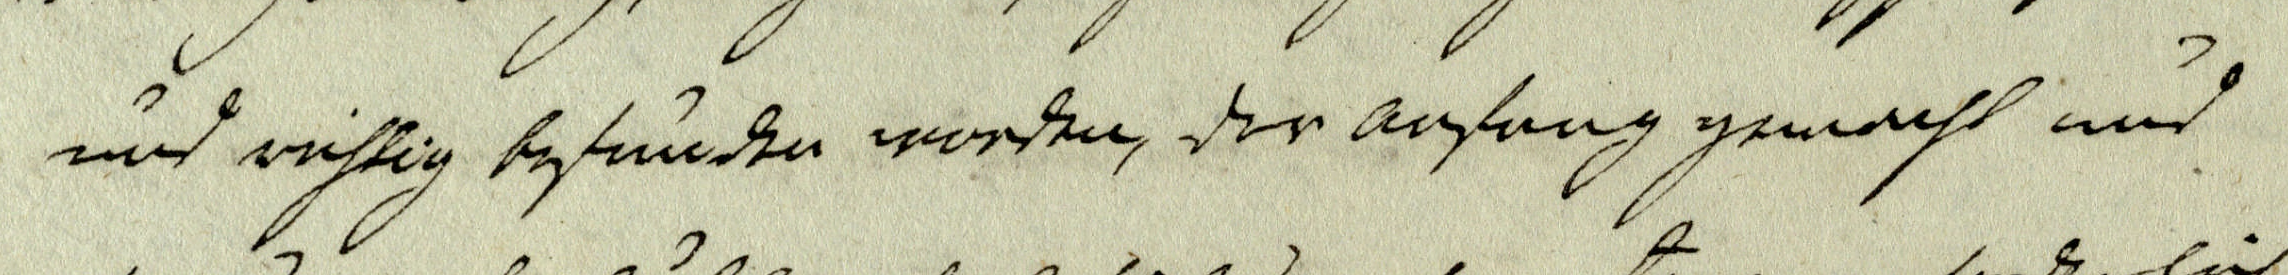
und richtig befunden worden, der Anfang gemacht und
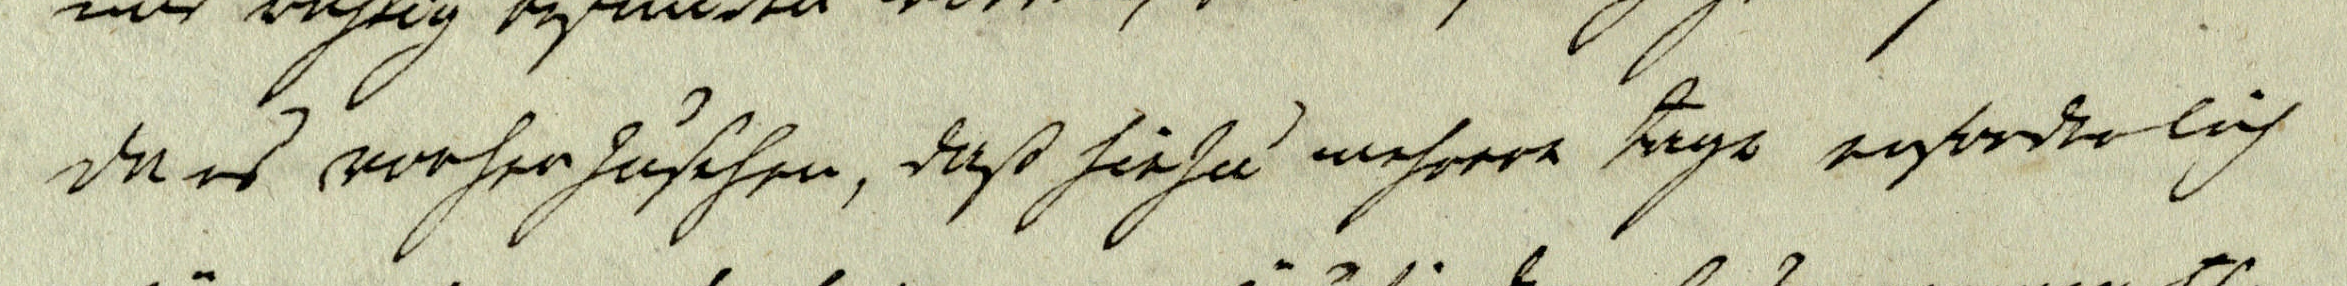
da es vorherzuschen, daß hiezu mehrere Tage erforderlich
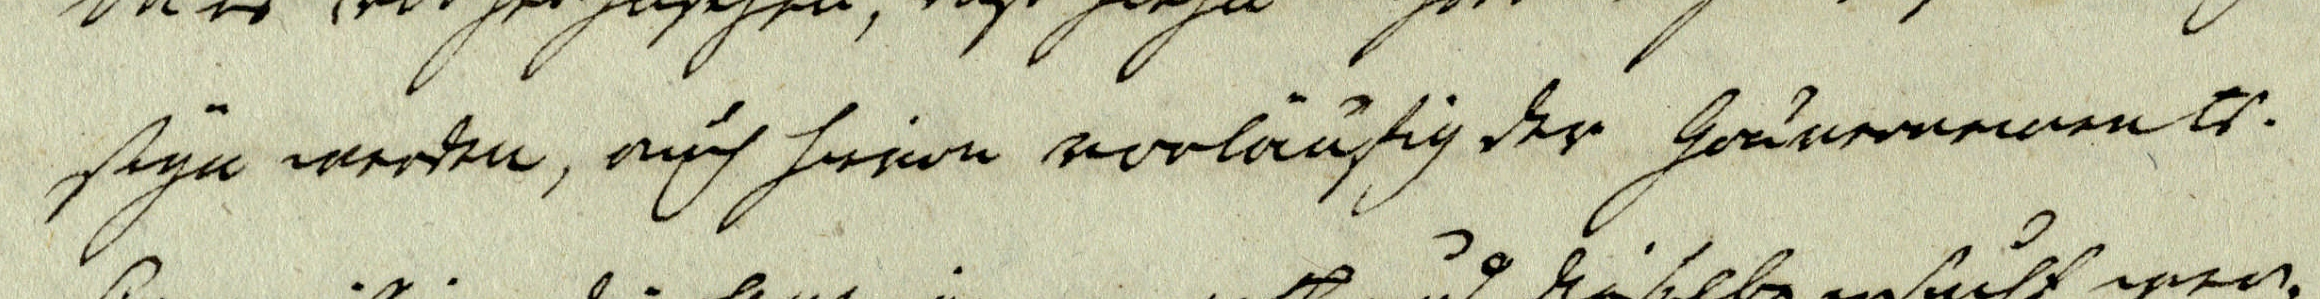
seÿn werden, auch hievon vorläufig der Gouvernements¬
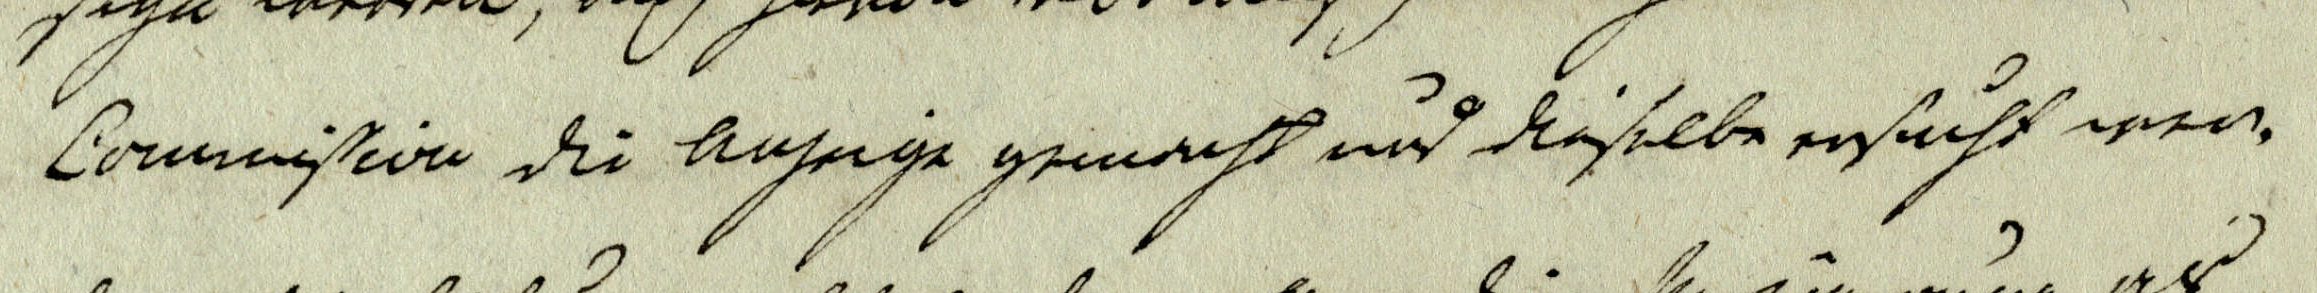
Commission die Anzeige gemacht und dieselbe ersucht wer¬
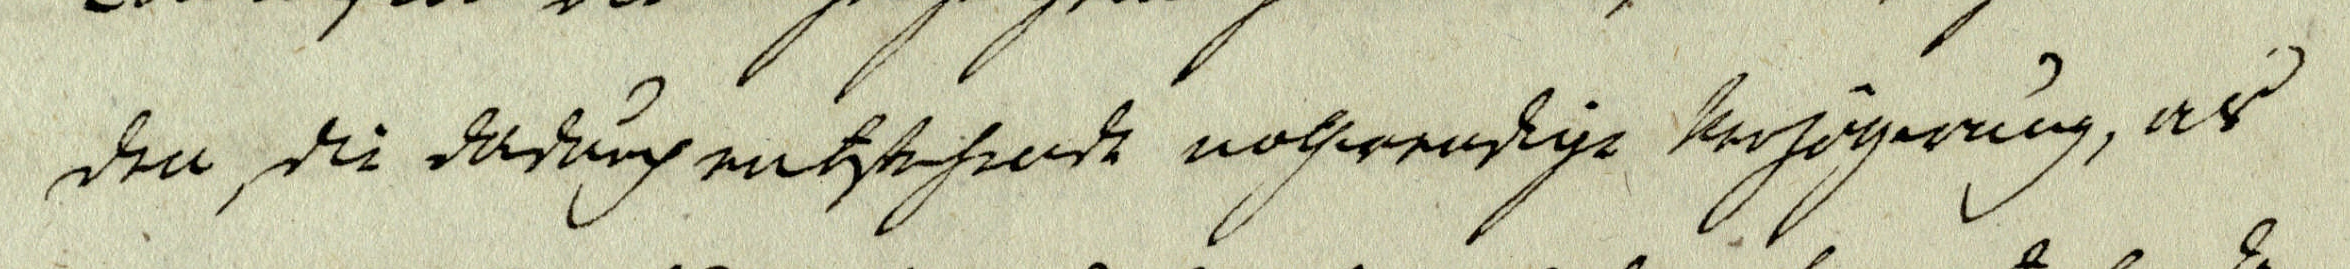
den, die dadurch entstehende nothwendige Verzögerung, als
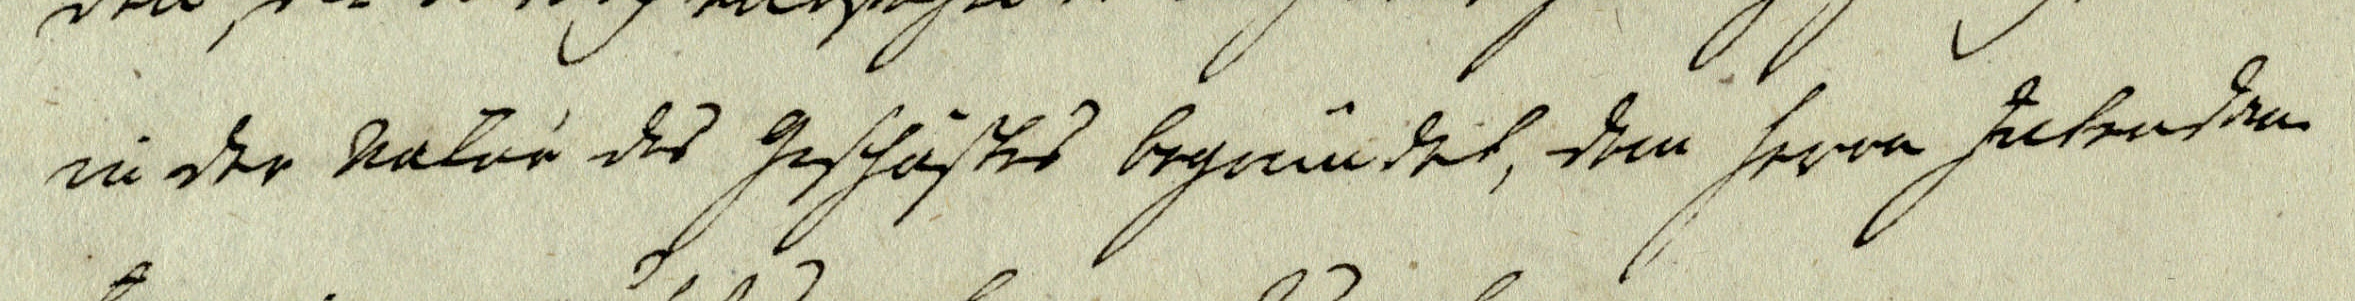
in der Natur des Geschäftes begründet, dem Herrn Intendan¬
